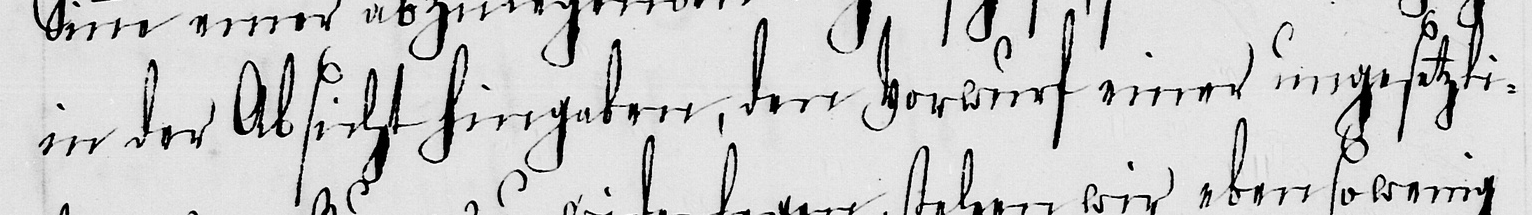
in der Absicht hingaben, den Vorwurf einer ungesetzli¬
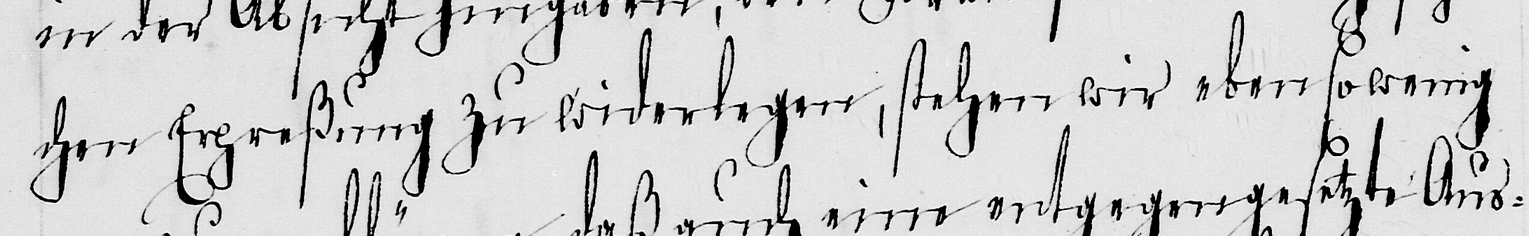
chen Erpreßung zu widerlegen, stehen wir ebensowenig
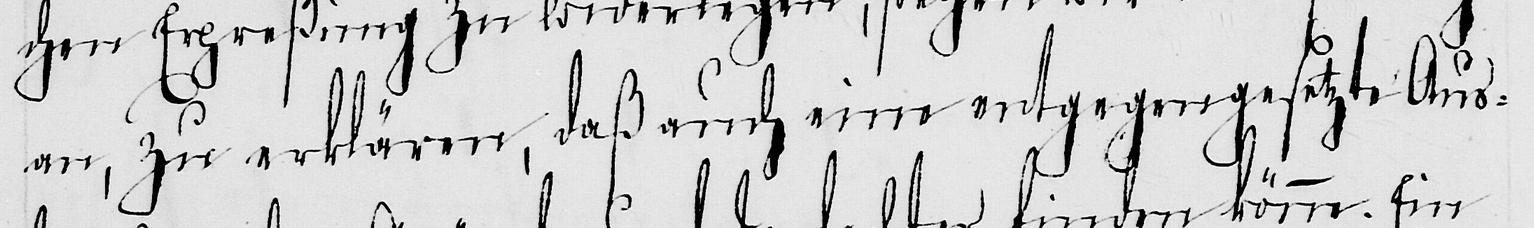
an, zu erklären, daß auch eine entgegengesetzte Aus¬
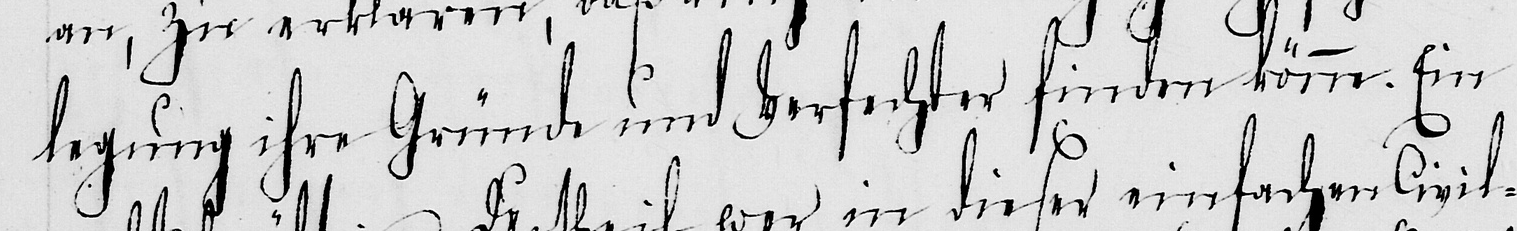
legung ihre Gründe und Verfechter finden könne. Ein
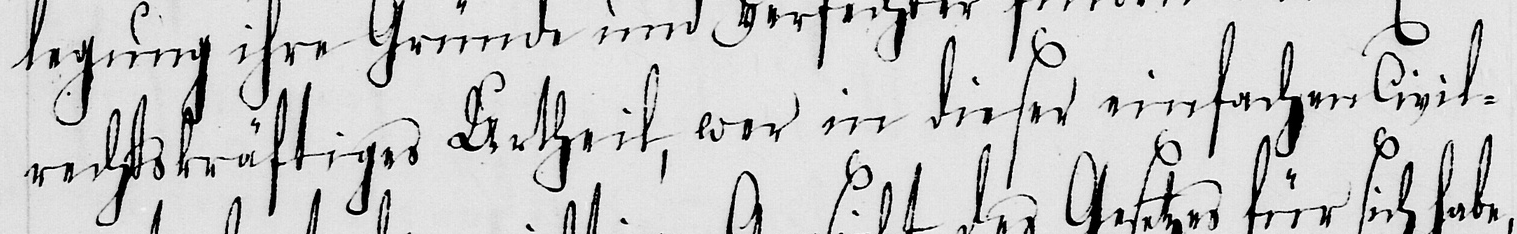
rechtskräftiges Urtheil, wer in dieser einfachen Civils¬
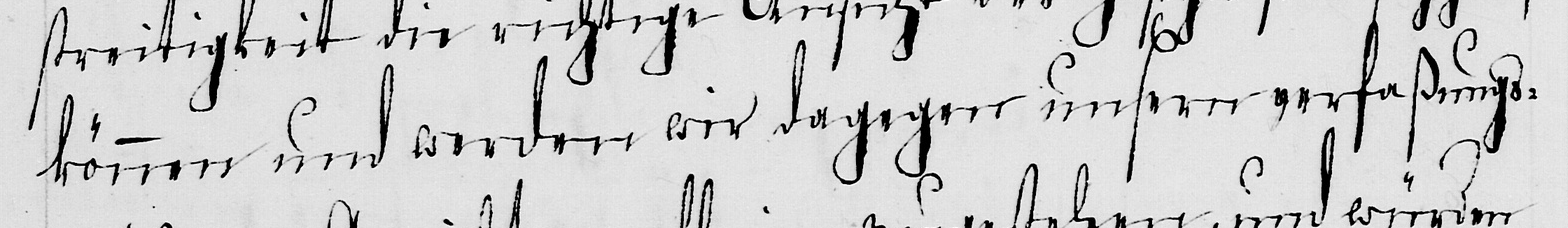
können und werden wir dagegen unsern verfaßungs¬
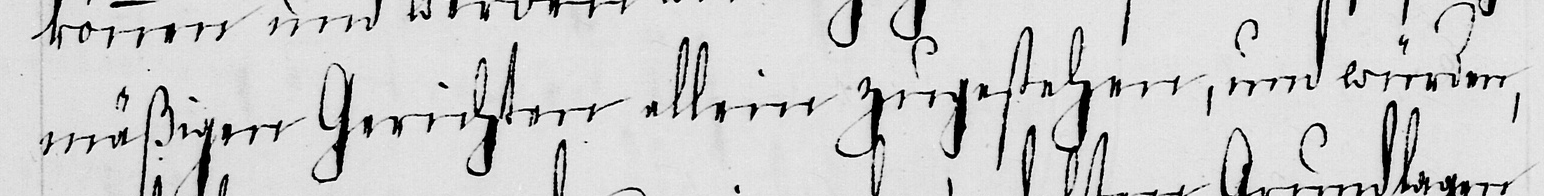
mäßigen Gerichten allein zugestehen, und würden,
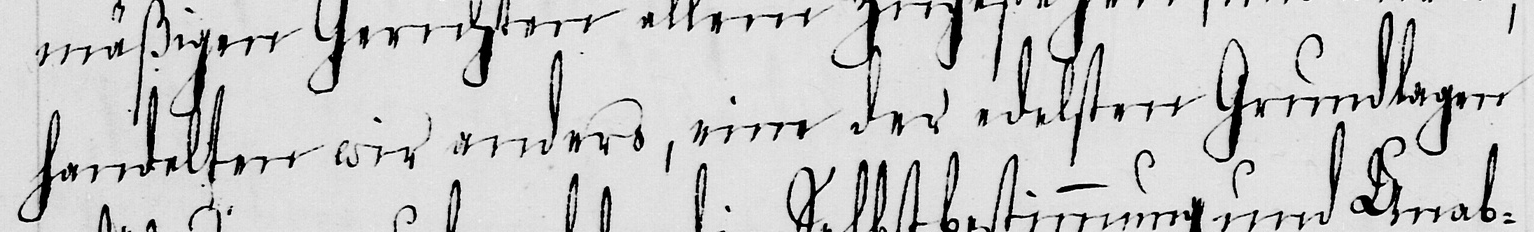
handelten wir anders, eine der edelsten Grundlagen
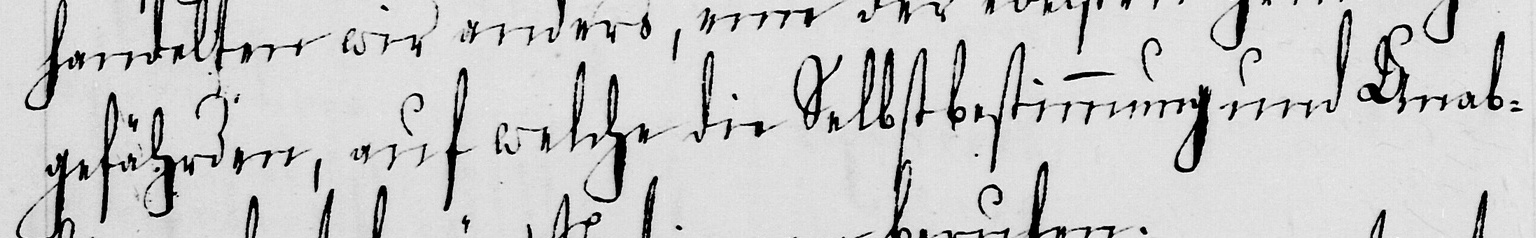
gefährden, auf welche die Selbstbestimmung und Unab¬
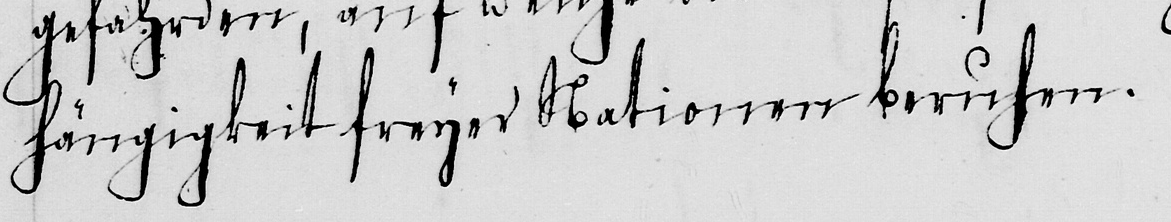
hängigkeit freyer Nationen beruhen.
